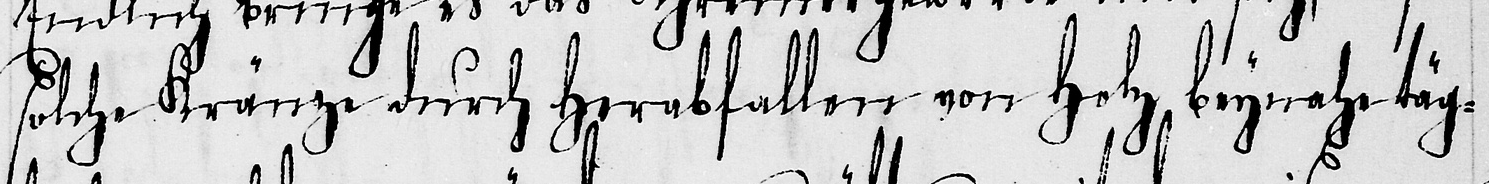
solche Kränze durch herabfallen von Holz beynahe täg¬
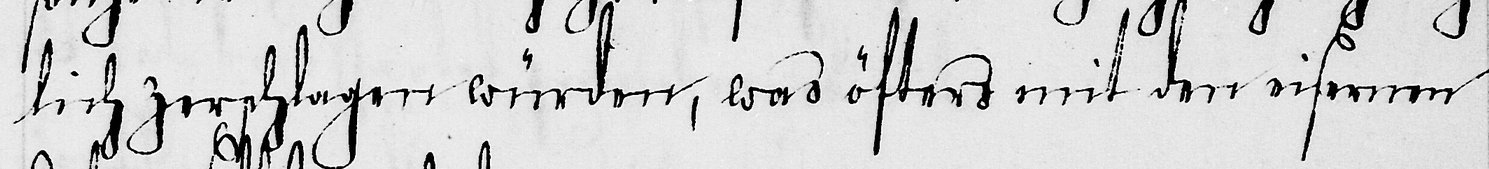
lich zerschlagen würden, was öfters mit den eisernen
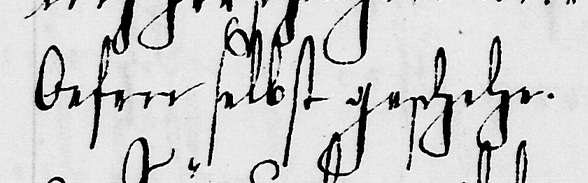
selbst geschehe.
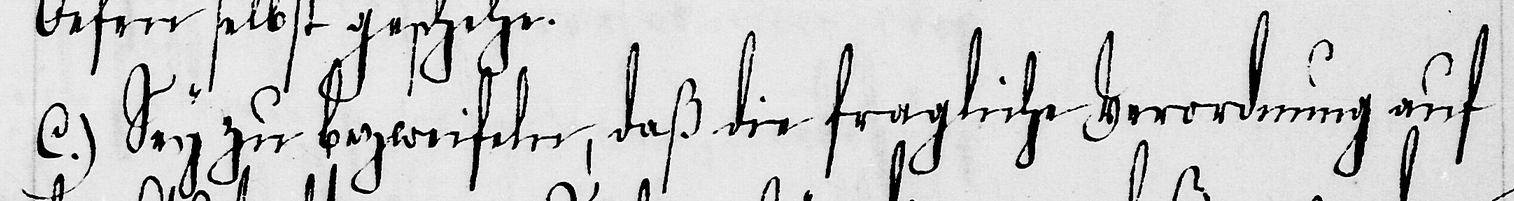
C.) Sey zu bezweifeln, daß die fragliche Verordnung auf
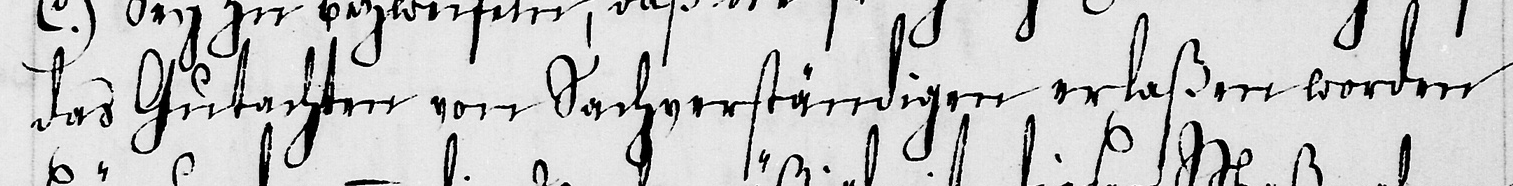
das Gutachten von Sachverständigen erlaßen worden
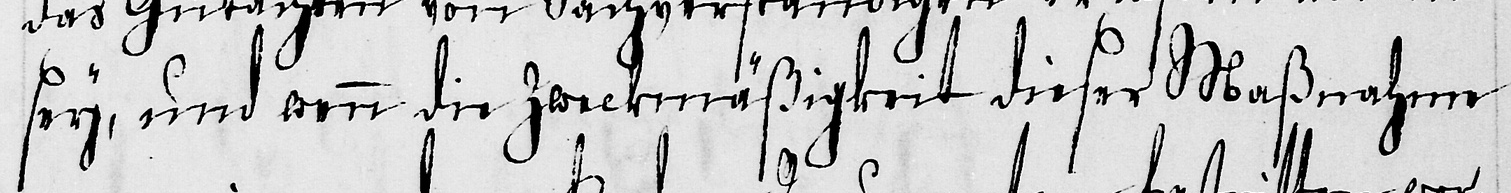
sey, und wenn die Zweckmäßigkeit dieser Maßnahme
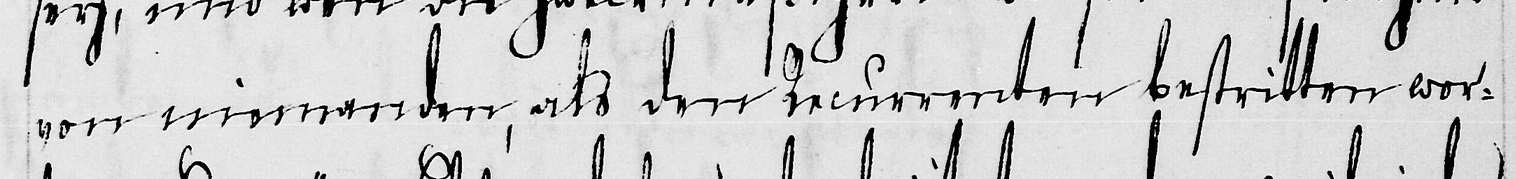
von niemanden, als den Recurrenten bestritten wor¬
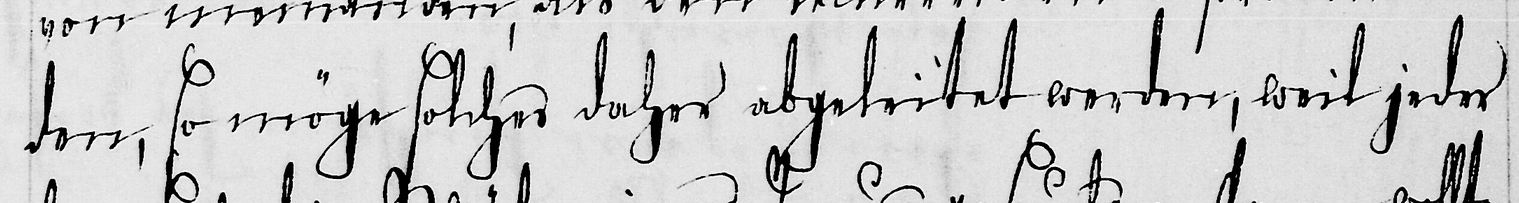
den, so möge solches daher abgeleitet werden, weil jeder
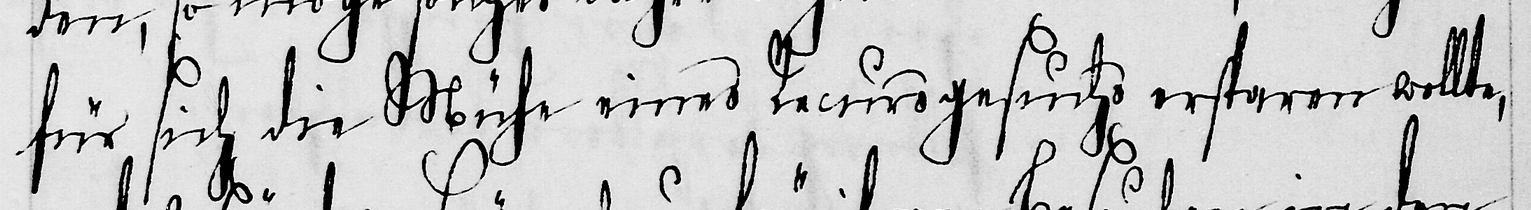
für sich die Mühe eines Recursgesuchs ersparen wollt¬
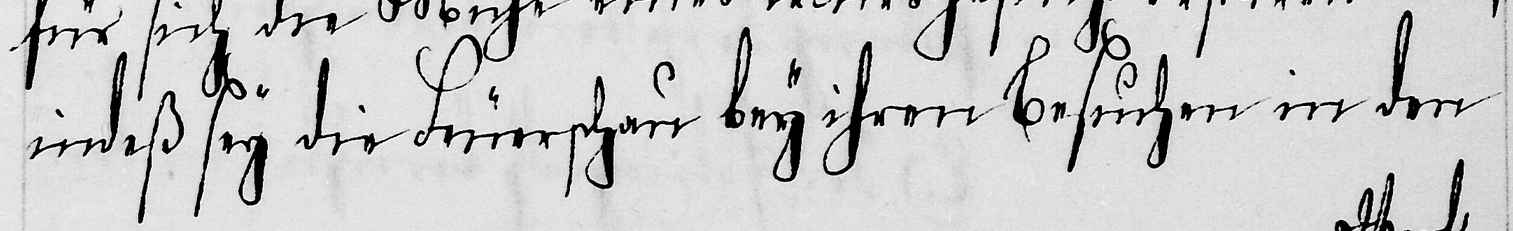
indeß sey die Feuerschau bey ihren Besuchen in den
